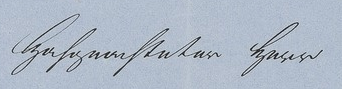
Hochgeachteter Herr
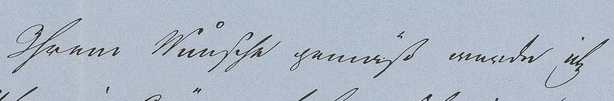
Ihrem Wunsche gemäß werde ich
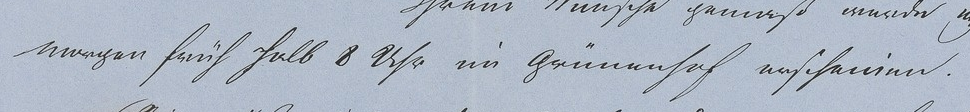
morgen früh halb 8 Uhr im Grünenhof erscheinen.
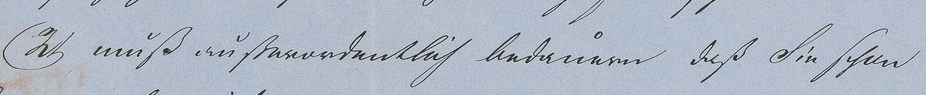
Ich muß außerordentlich bedauern daß Sie schon
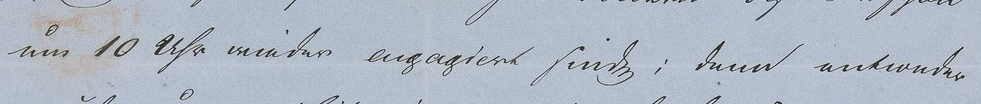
um 10 Uhr wieder engagiert sind; denn entweder
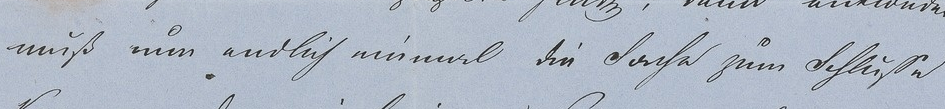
muß nun endlich einmal die Sache zum Schlusse
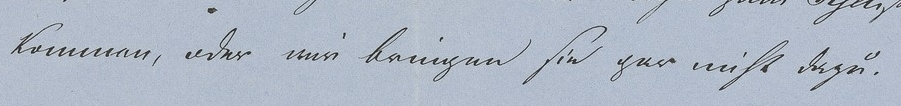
kommen, oder wir bringen sie gar nicht dazu.
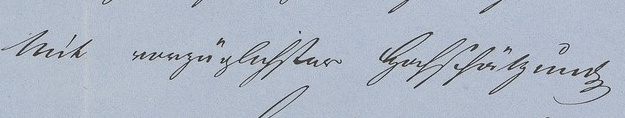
Mit vorzüglichster Hochschätzung
